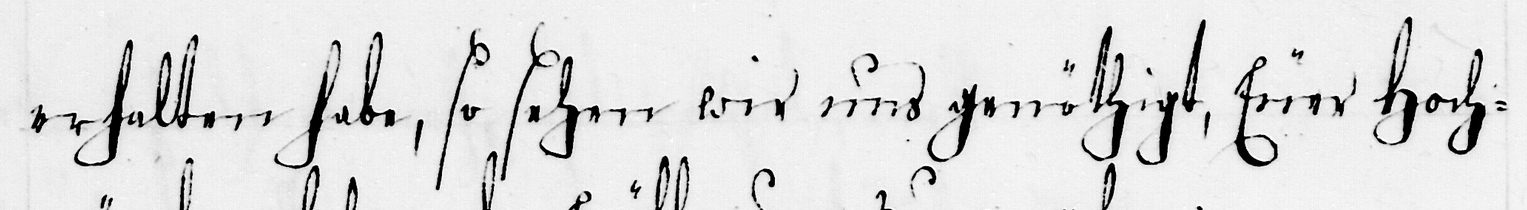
erhalten habe, so sehen wir uns genöthigt, Euer Hoch¬
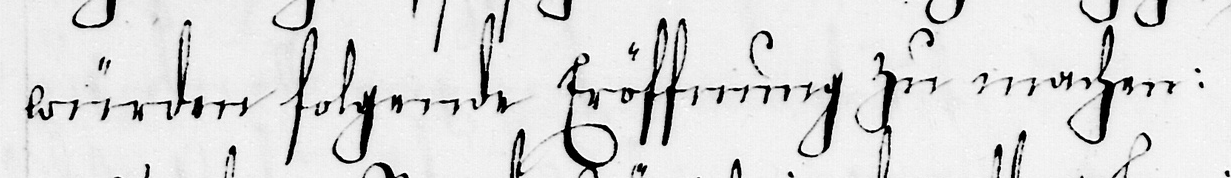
würden folgende Eröffnung zu machen:
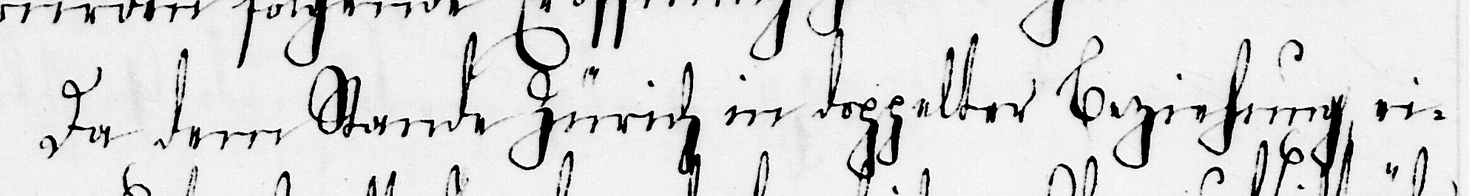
Da dem Stande Zürich in doppelter Beziehung, ei¬
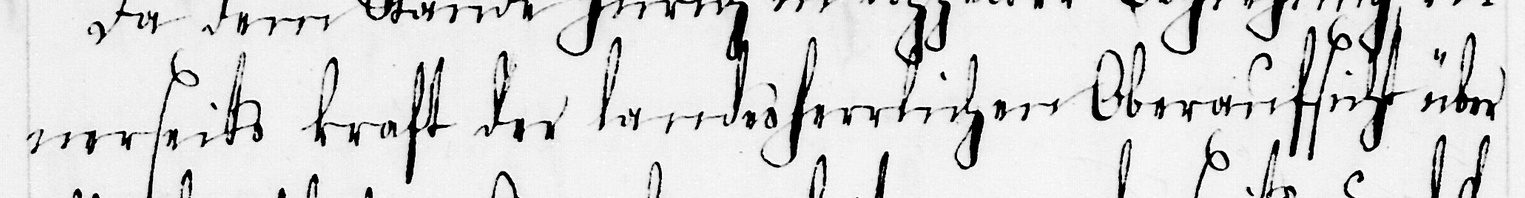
nerseits kraft der landesherrlichen Oberaufsicht über
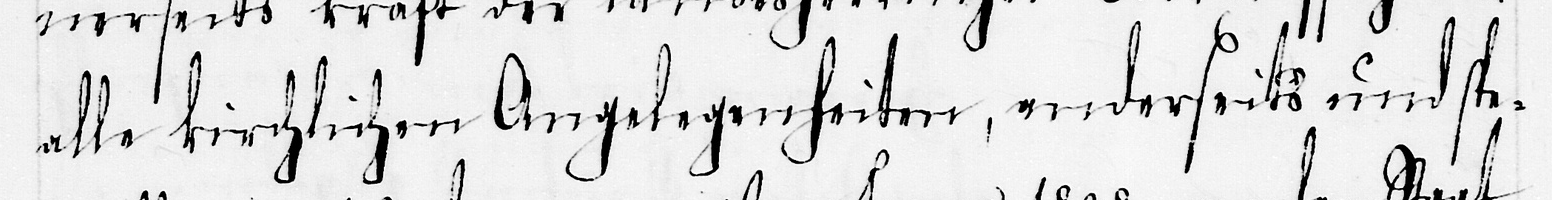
alle kirchlichen Angelegenheiten, anderseits und spe¬
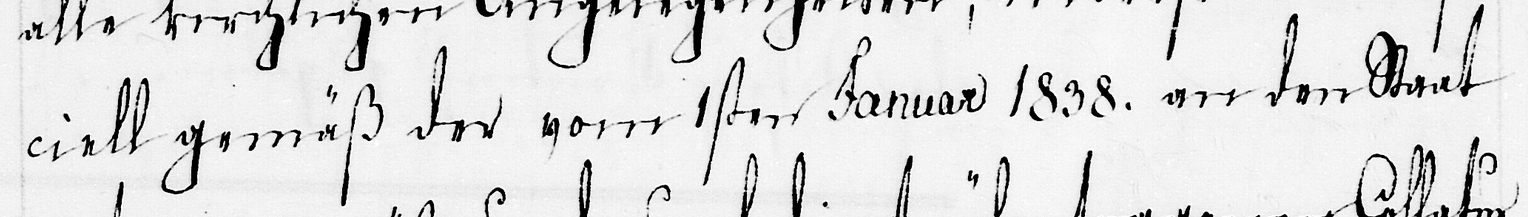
ciell gemäß der vom 1sten Januar 1838. an den Staat
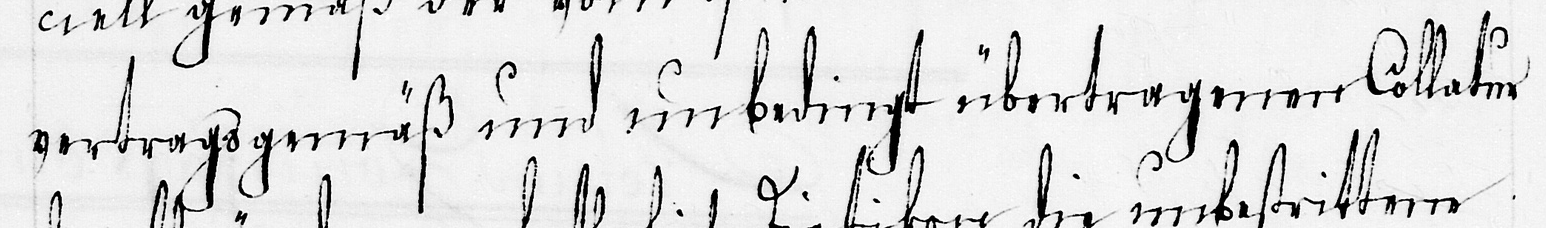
vertragsgemäß und unbedingt übertragenen Collatur
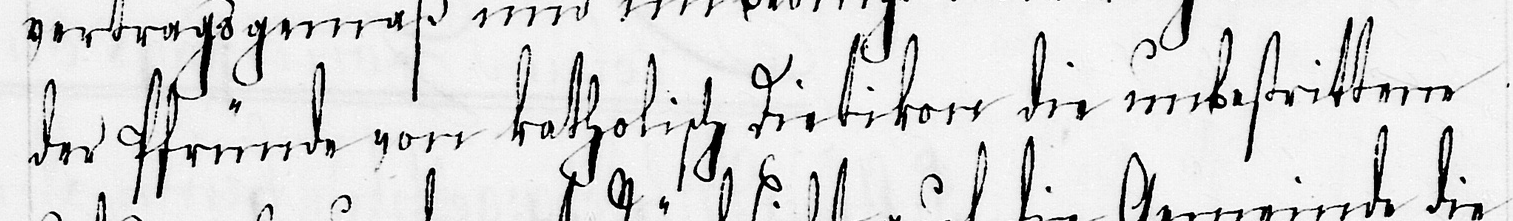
der Pfründe von katholisch Dietikon die unbestrittene
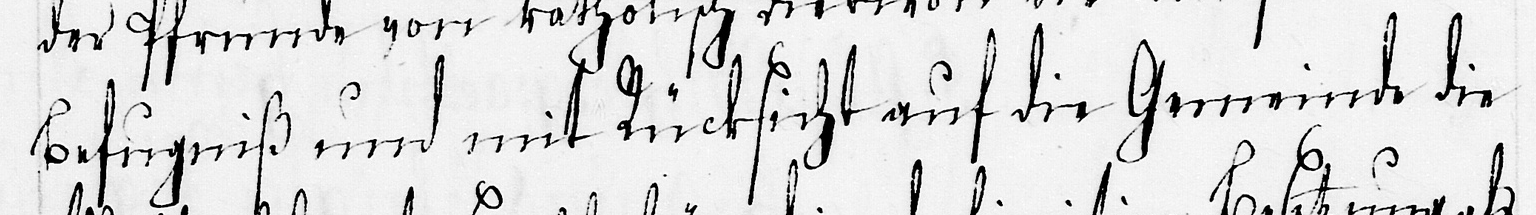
Befugniß und mit Rücksicht auf die Gemeinde die
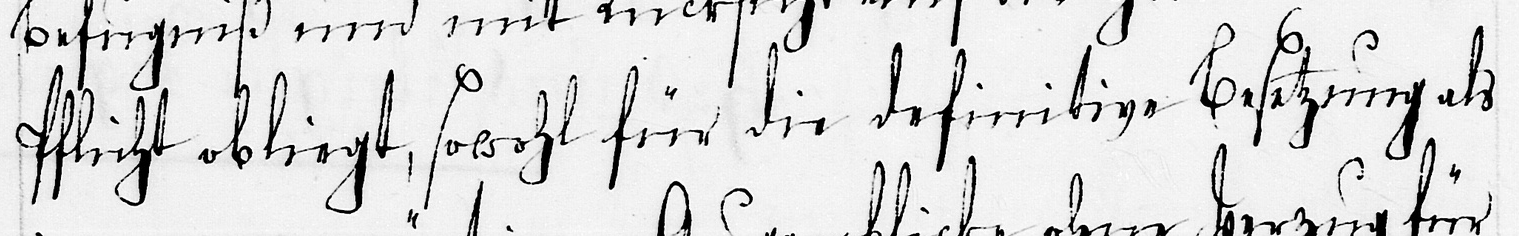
Pflicht obliegt, sowohl für die definitive Besetzung als
